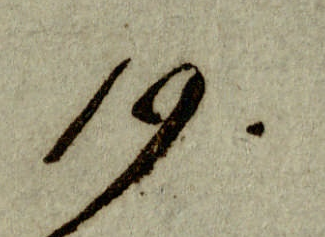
19.
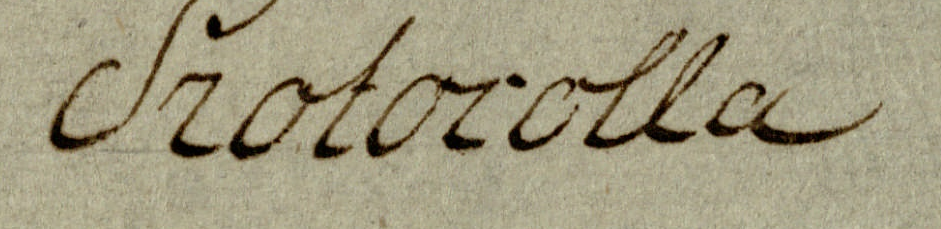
Protocolla
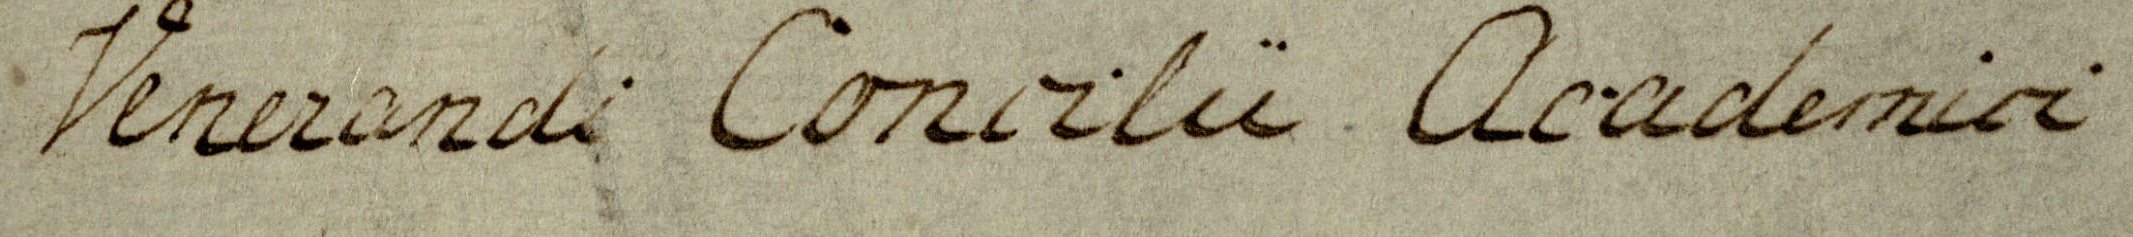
Venerandi Concilii Academici
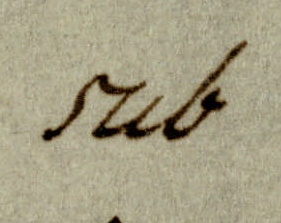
sub
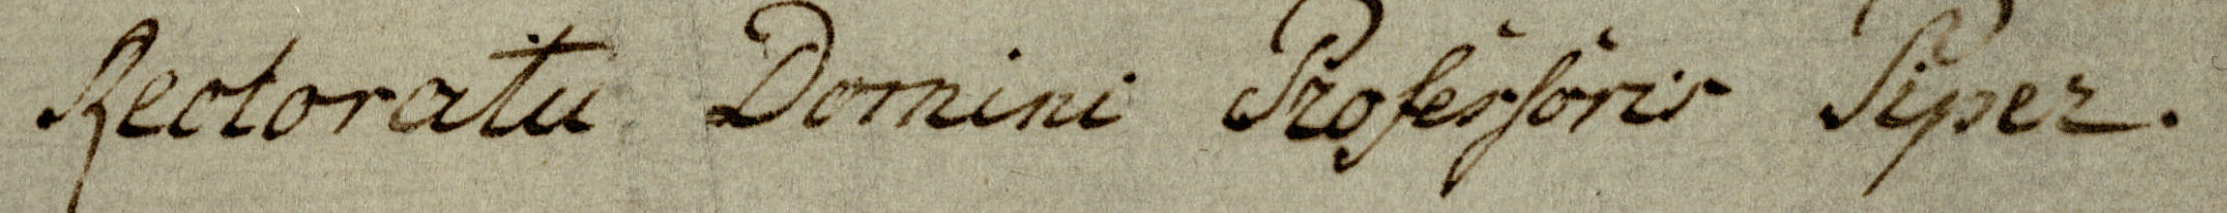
Rectoratu Domini Professoris Piper.
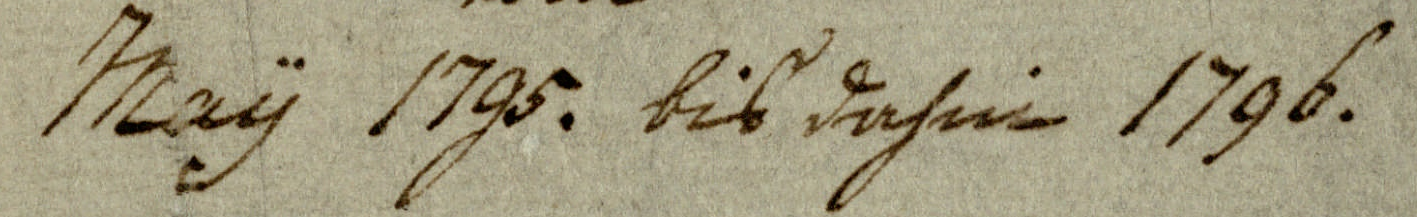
Maÿ 1795. bis dahin 1796.
